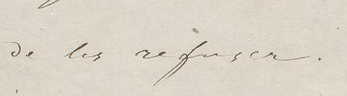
de les refuser. –
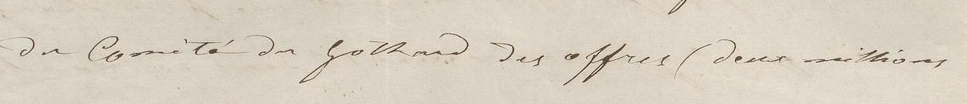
du Comité du Gothard des offres (deux millions
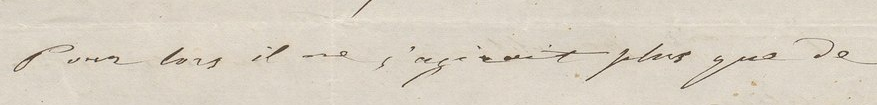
Pour lors il ne s'agirait plus que de
